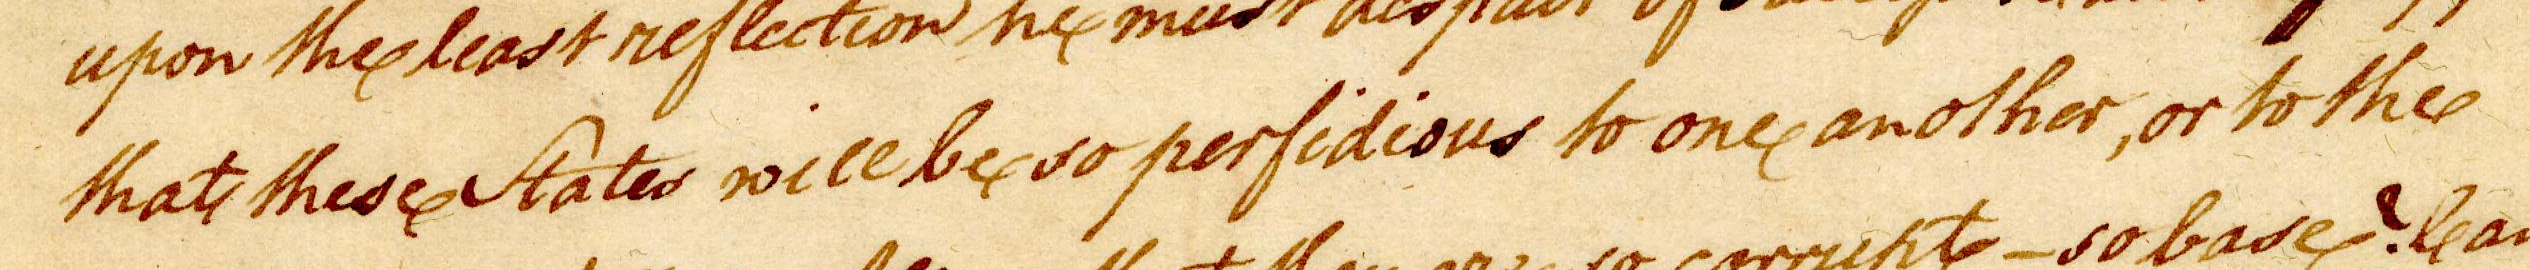that these States will be so perfidious to one another, or to the
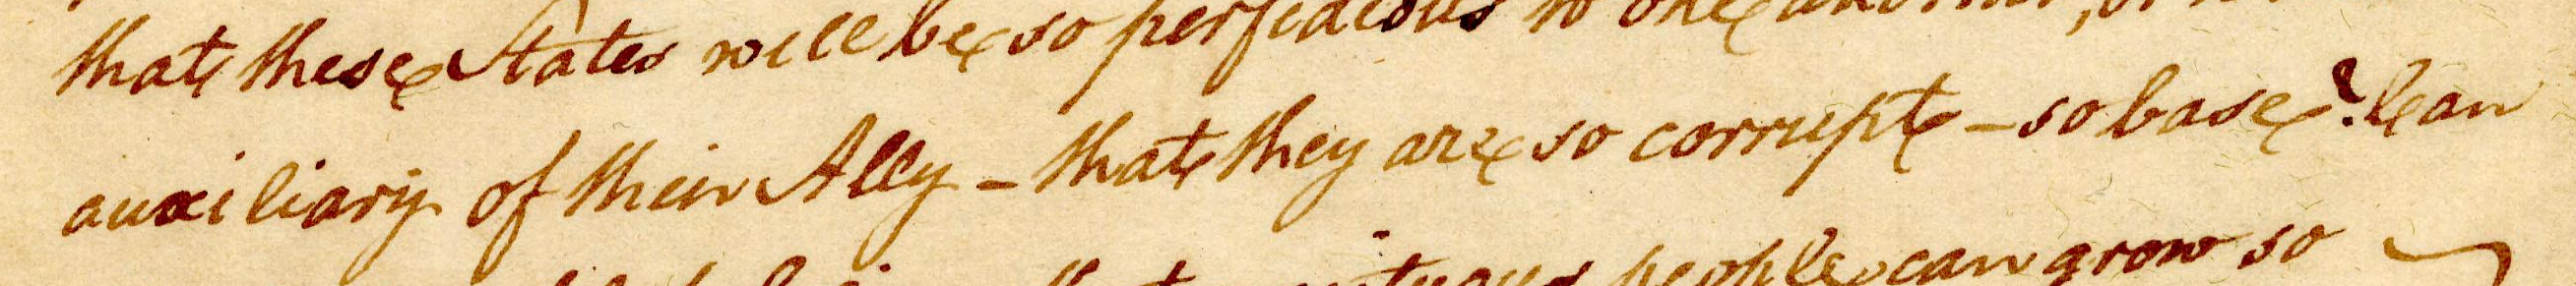auxiliary of their Ally- that they are so corrupt- so base? Can
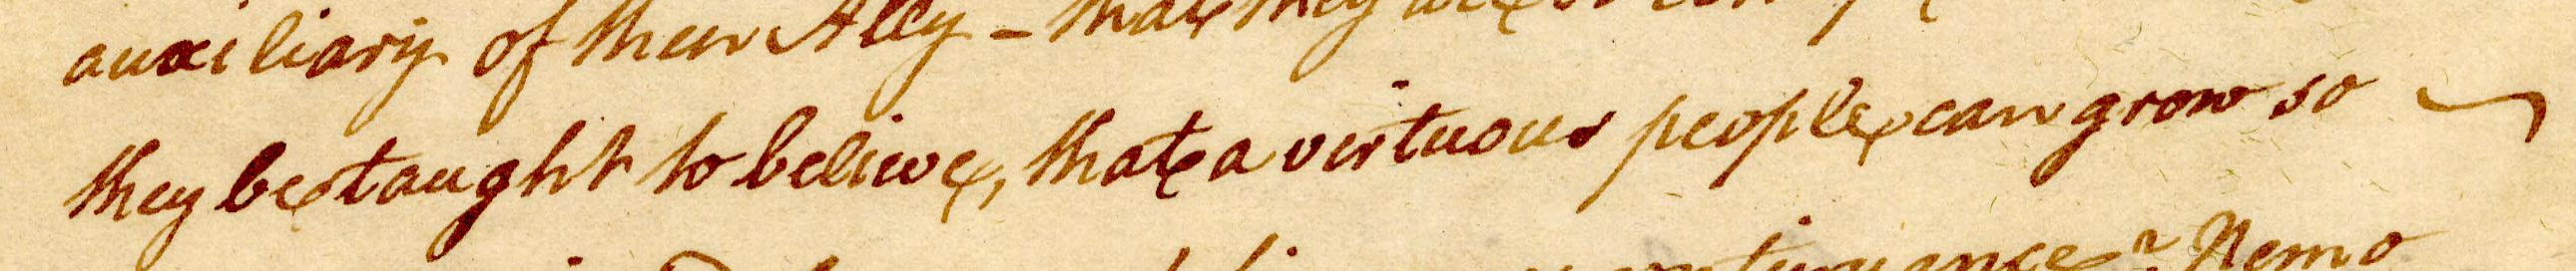they be taught to believe, that a virtuous people can grow so-
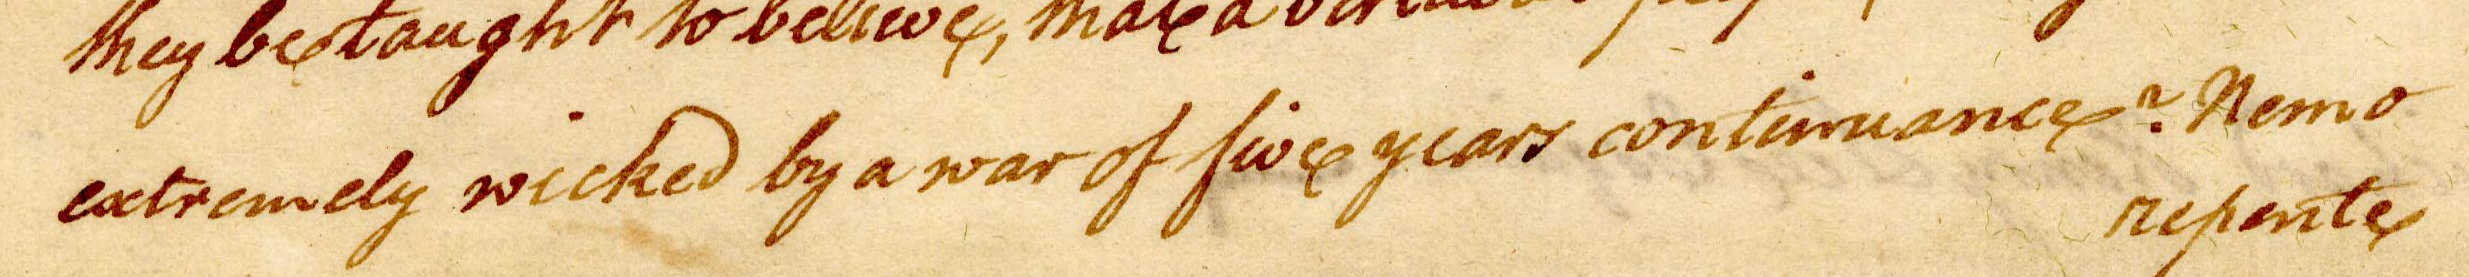extremely wicked by a war of five years continuance? Nemo
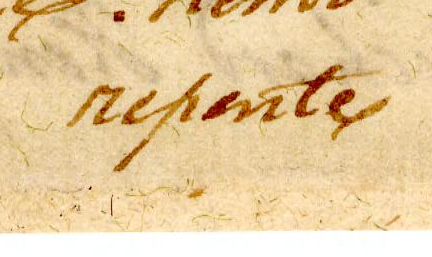repente
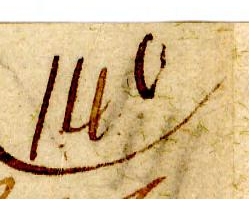140
